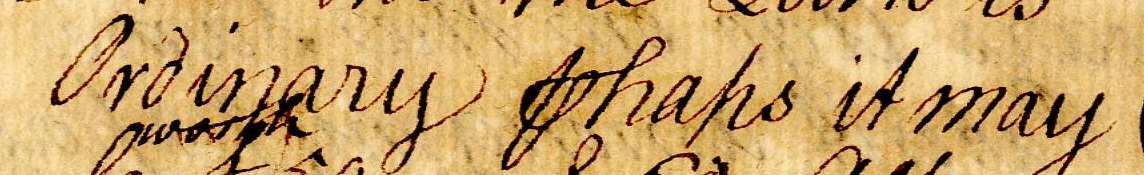Ordinary perhaps it may
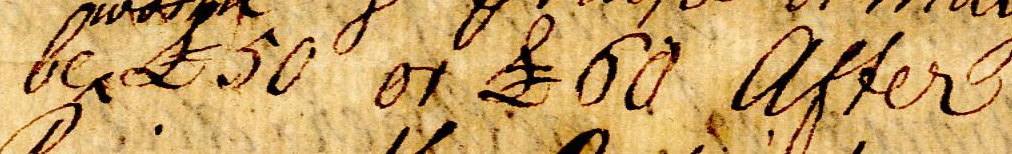be £50 or £60 After
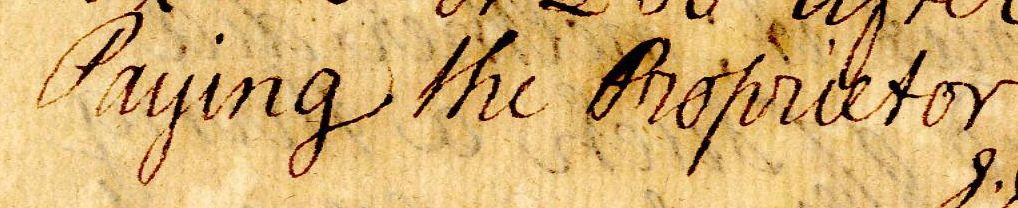Paying the Proprietor
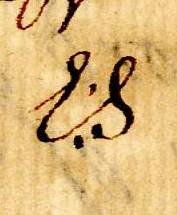E:S
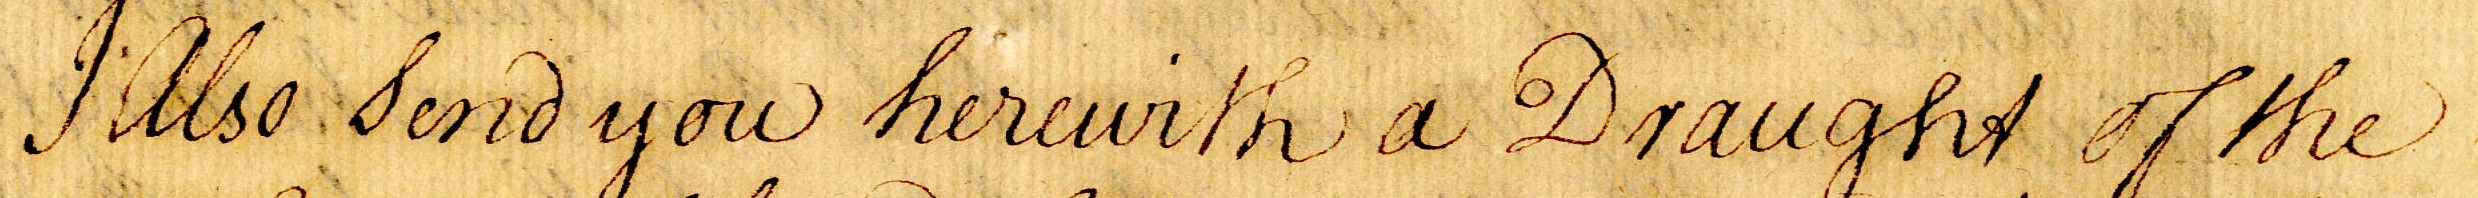I Also Send you herewith a Draught of the
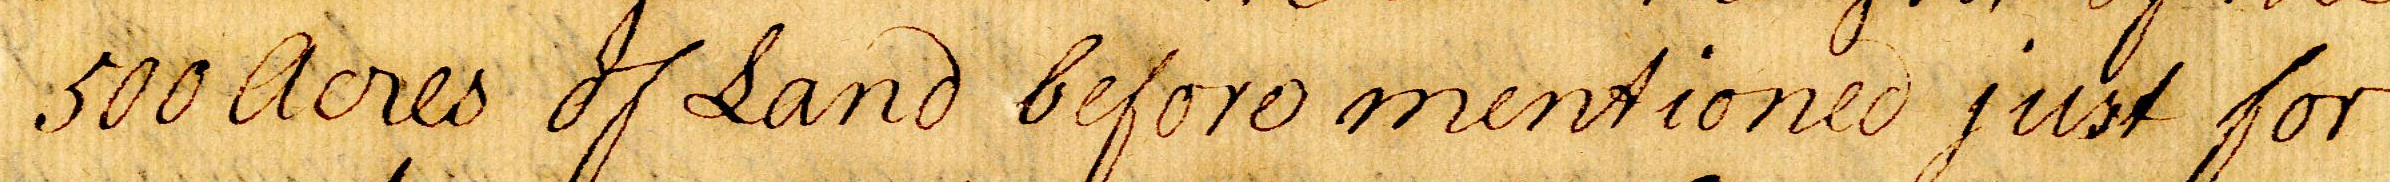500 Acres of Land before mentioned just for
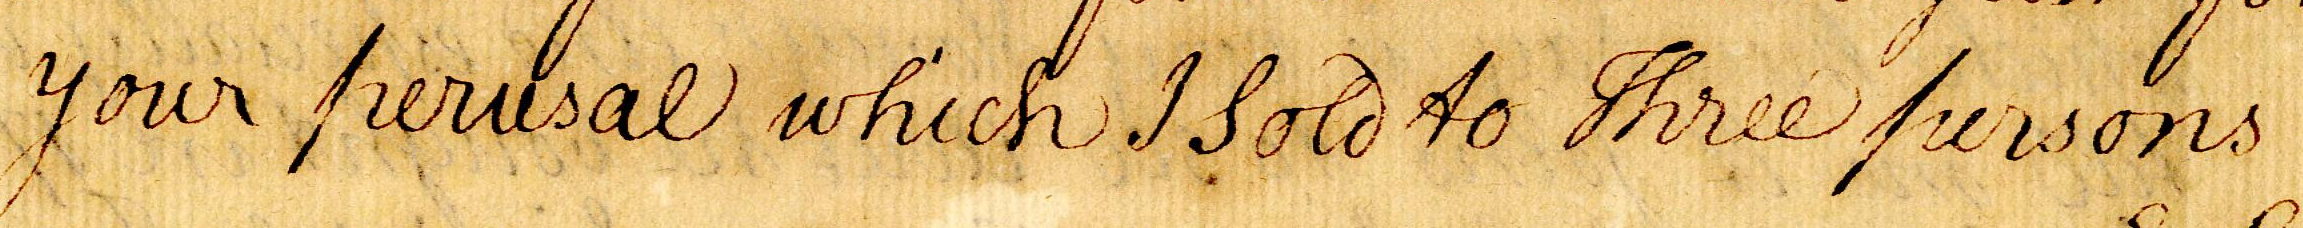Your perusal which I Sold to Three persons
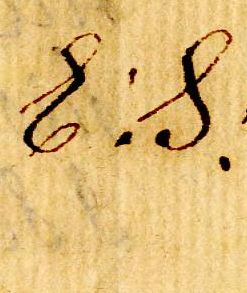E:S:
